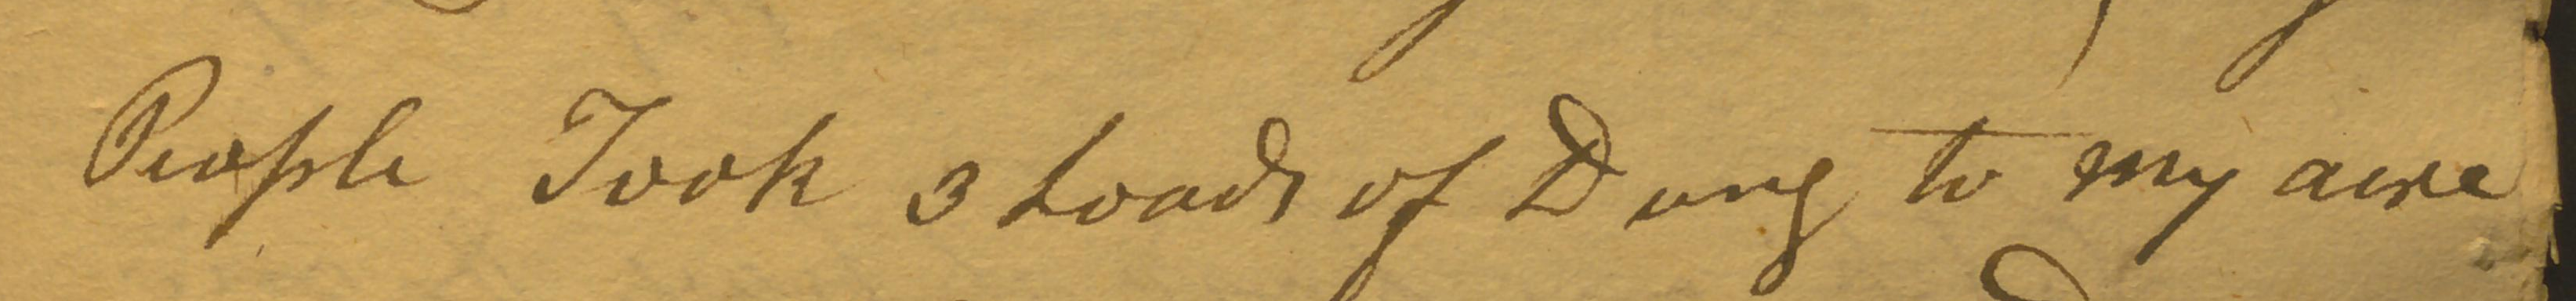People Took 3 Loads of Dung to my acre
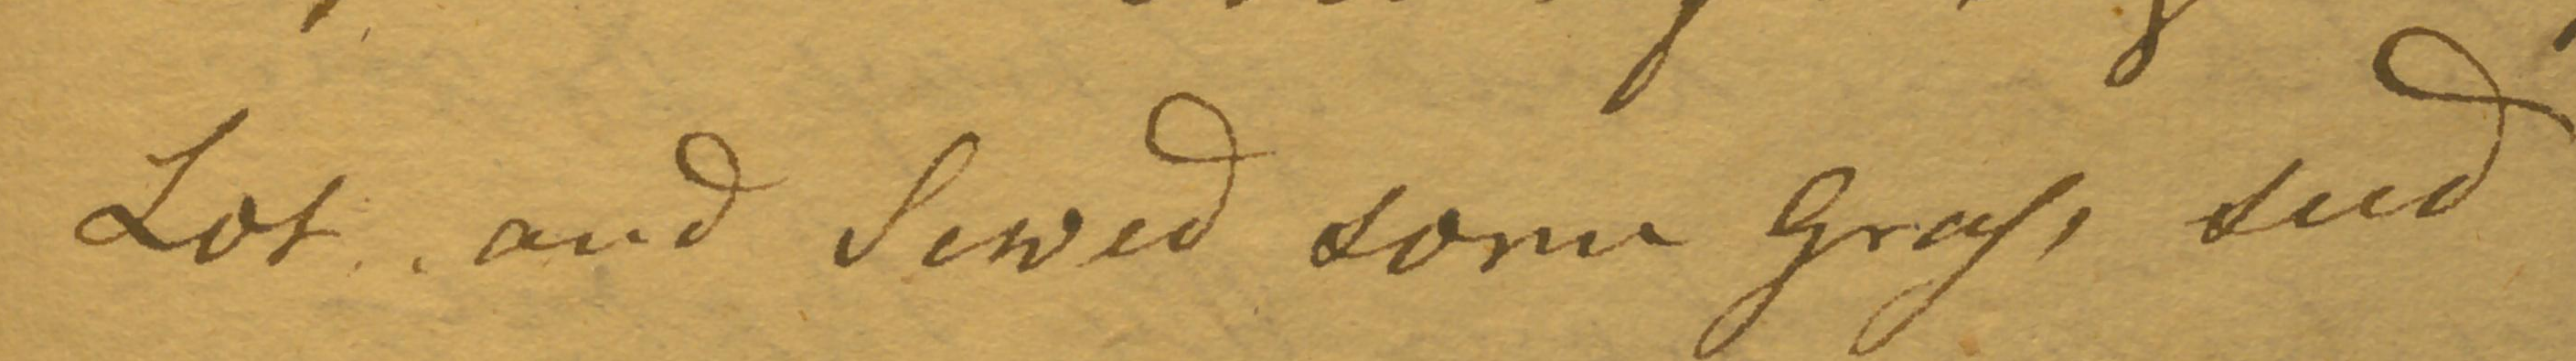Lot and sewed some Grass seed
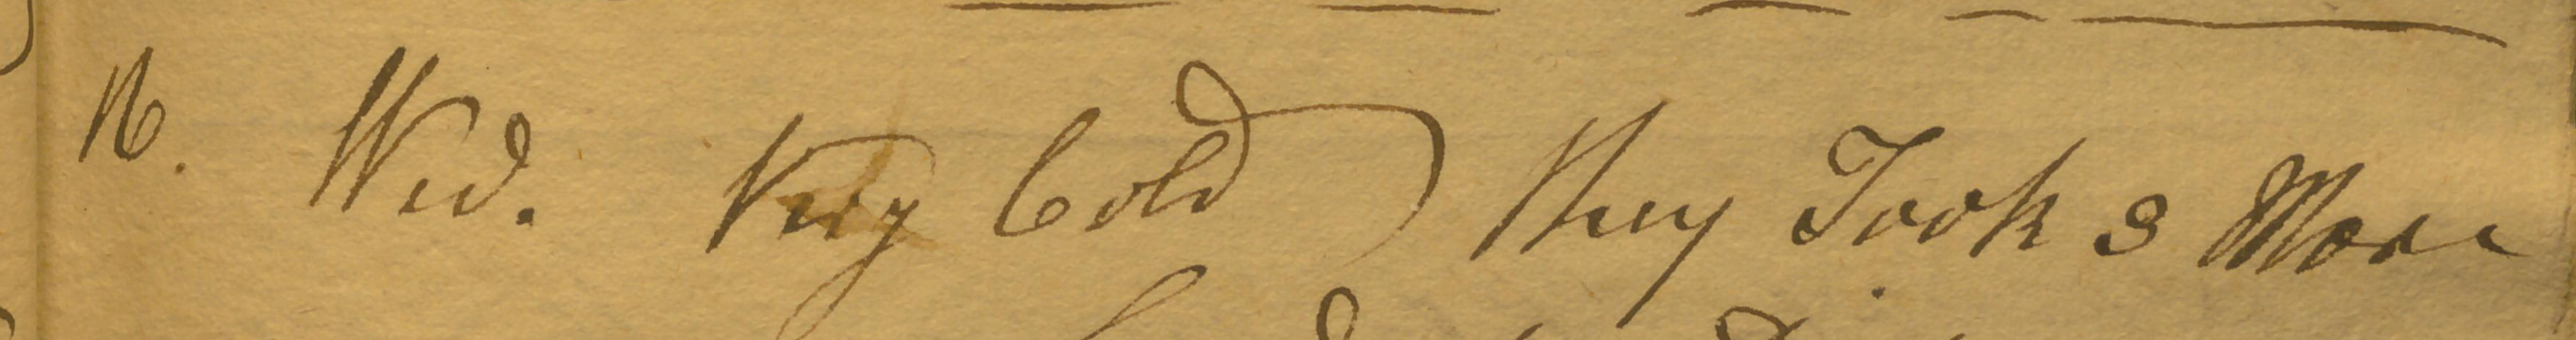16. Wed. Very Cold they Took 3 More
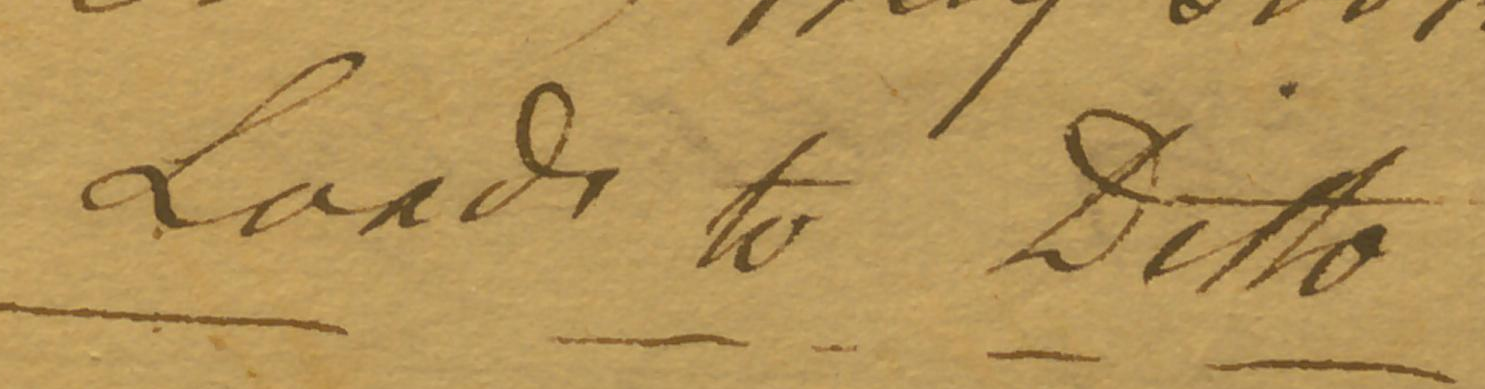Loads to Ditto
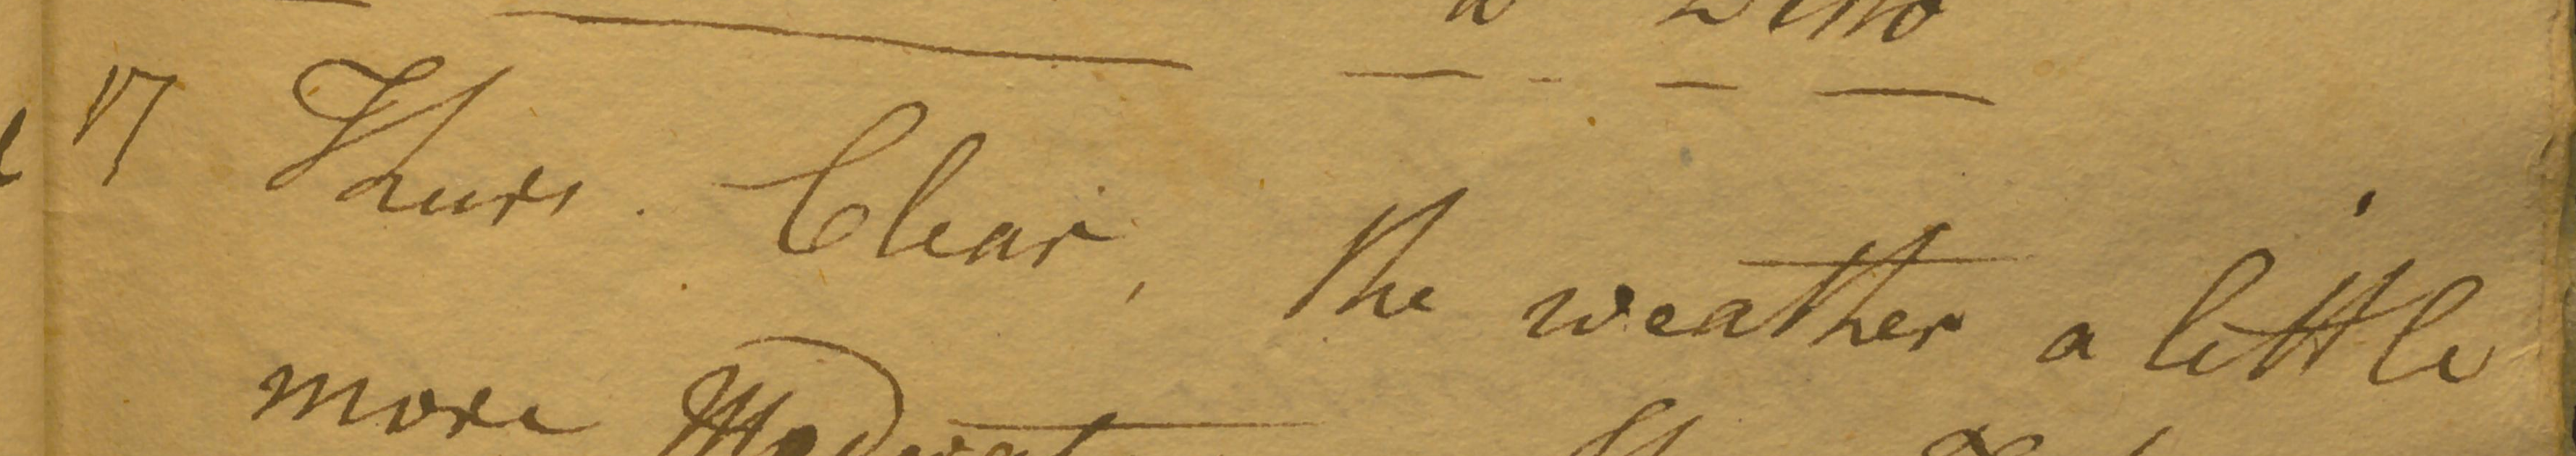17 Thurs. Clear the weather a little
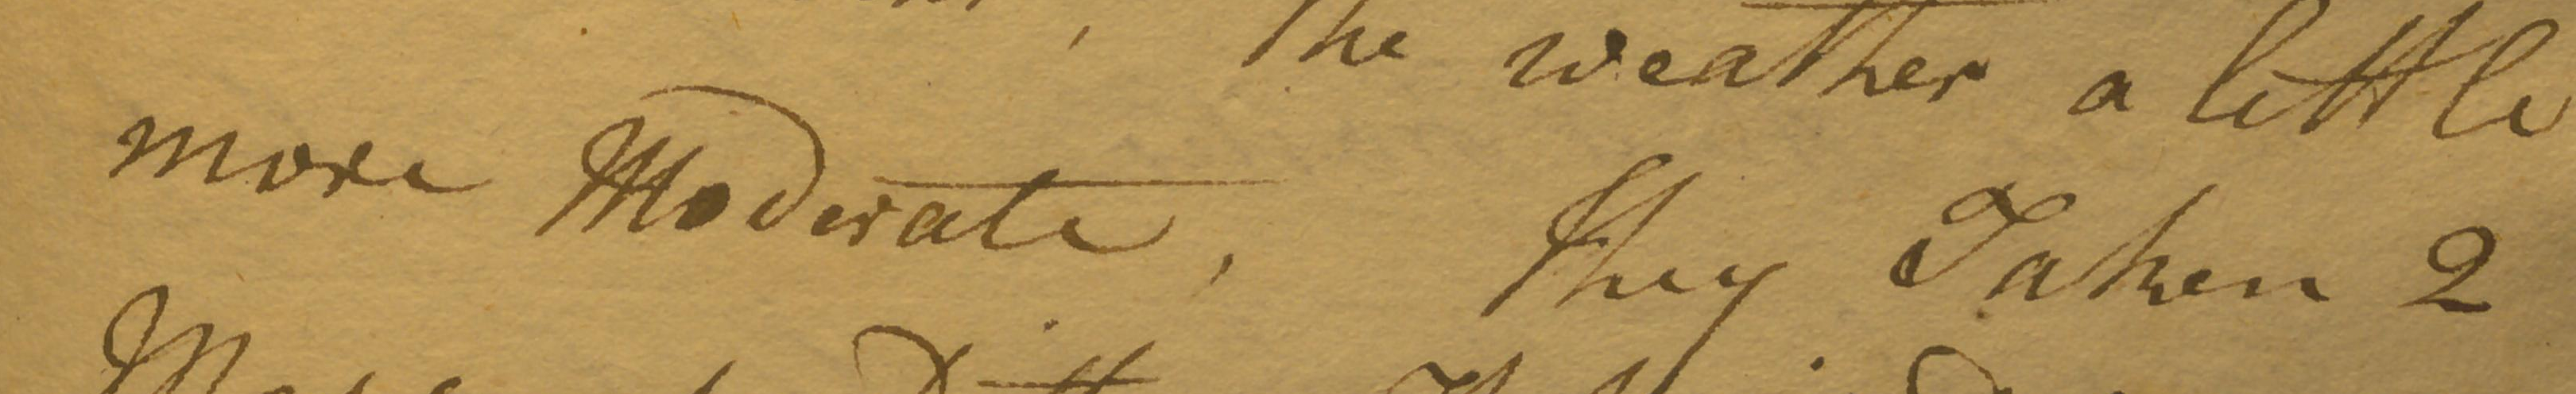more Moderate, They Taken 2
